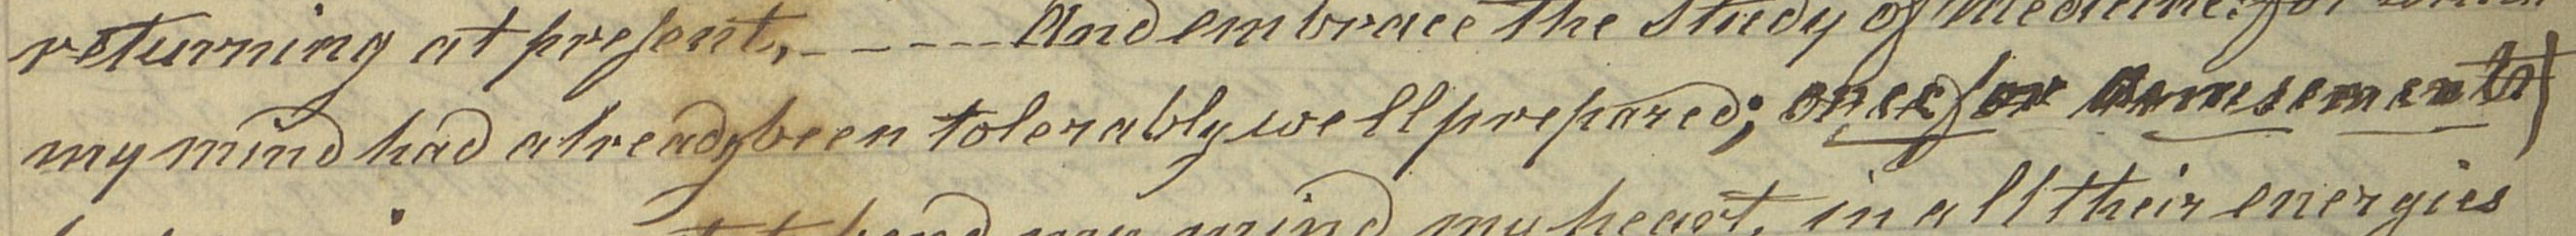my mind had atrend, been tolerably well prepared; once for amusements)
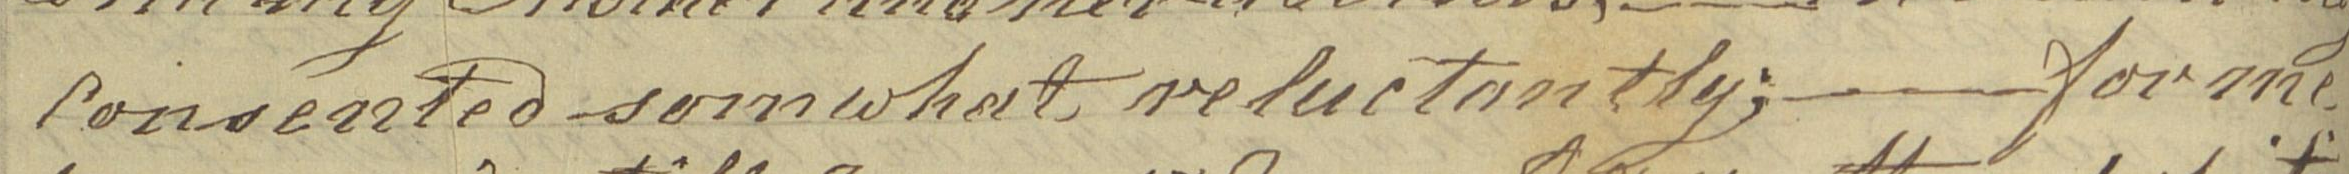consented - somwhat reluctantly; for me
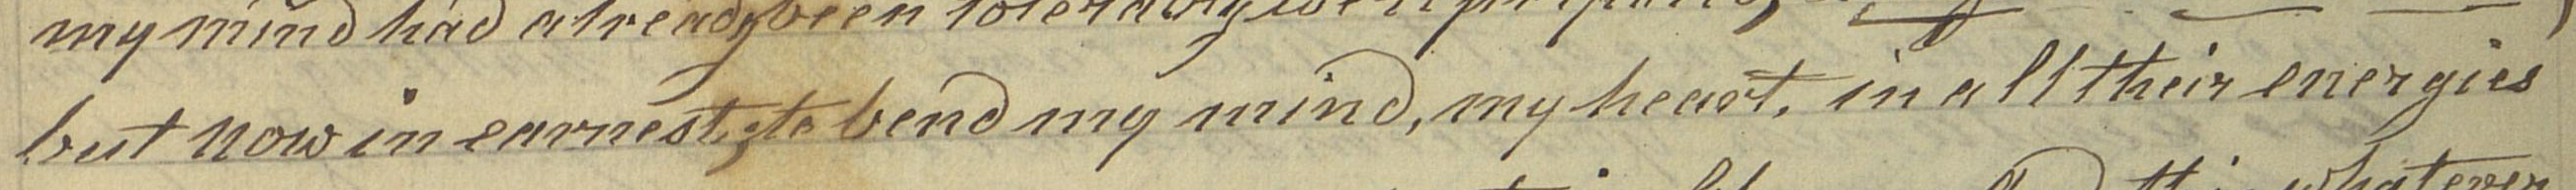but now in earnest; to bend my mind, my heart, in all their energies
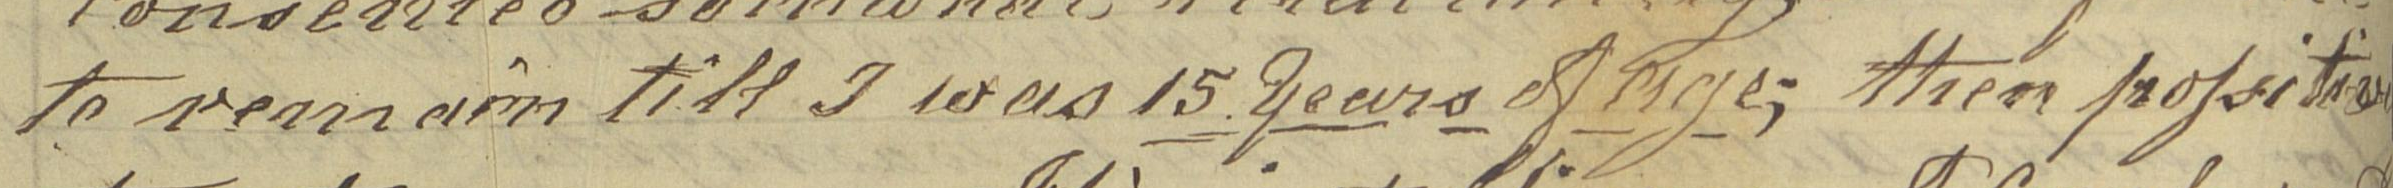to remain till I was 15 years of Age; then possitiv
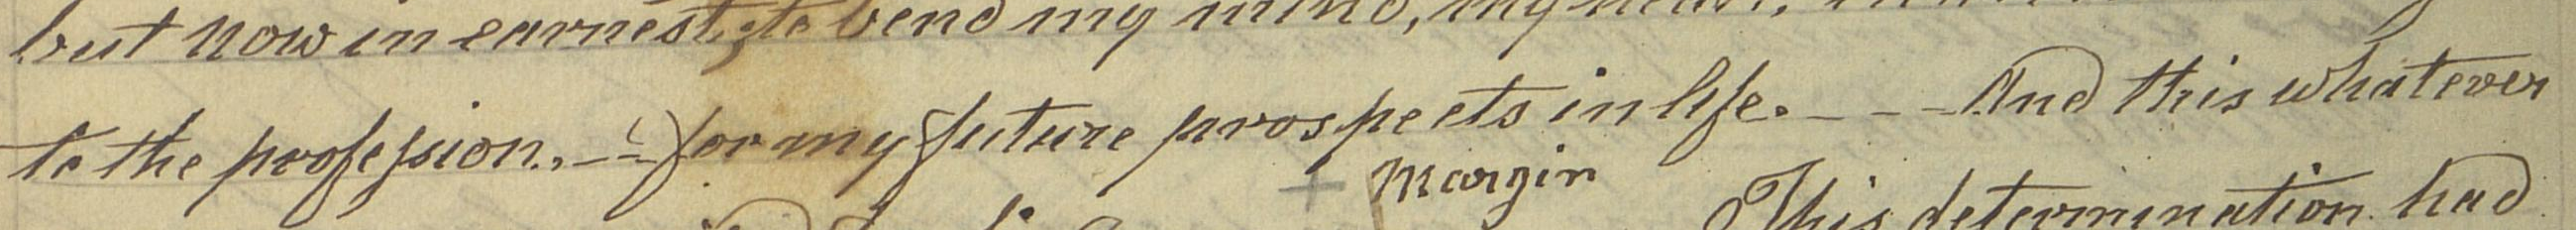to the profession.- for my future prospects in life. And this whatever
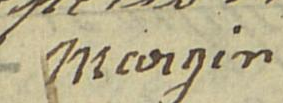Margin
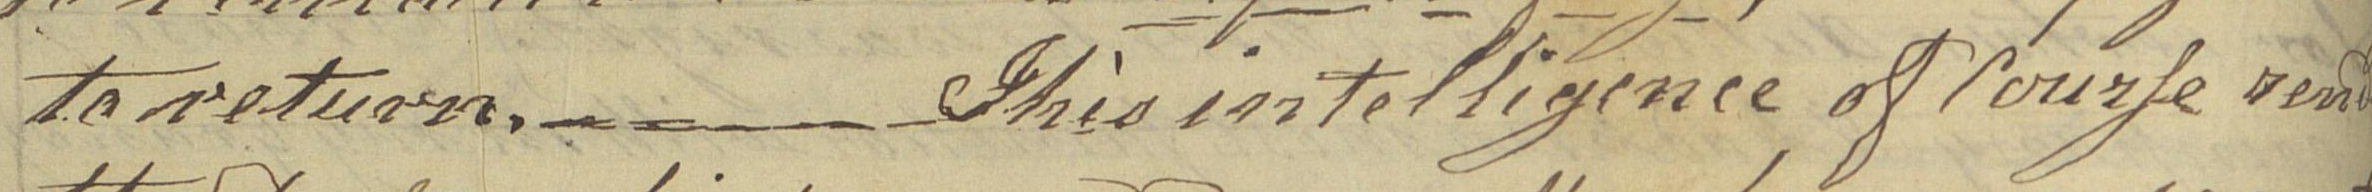to return.-- This intelligence of Course ren-
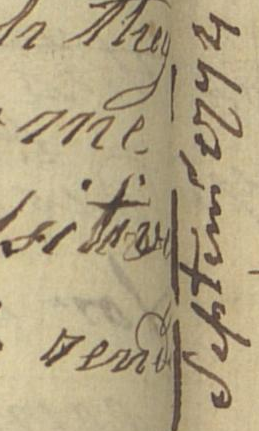Septem^r 1774
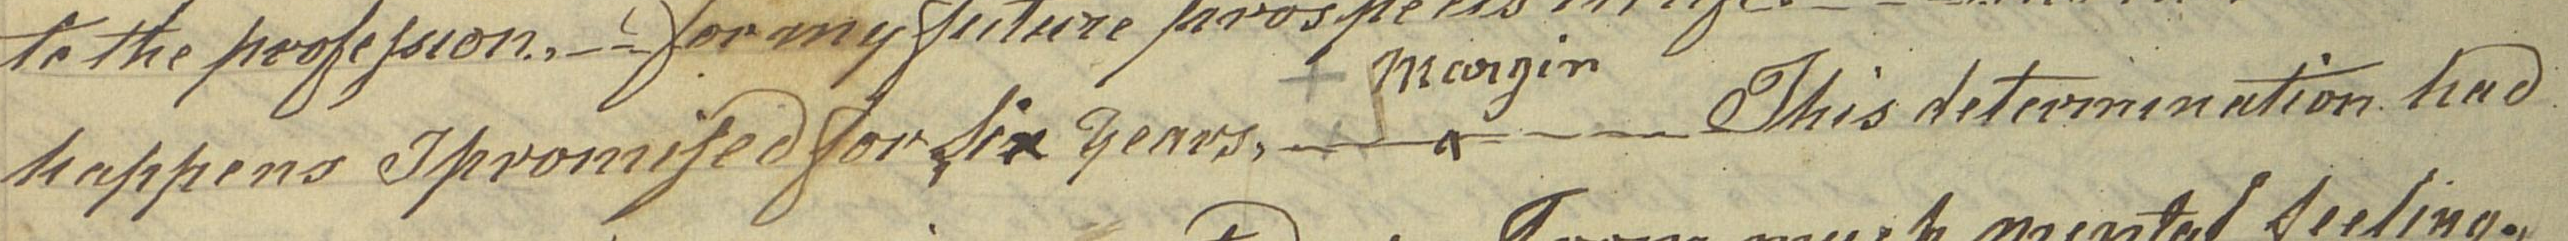happens I promised for six Years, ^ This determination had
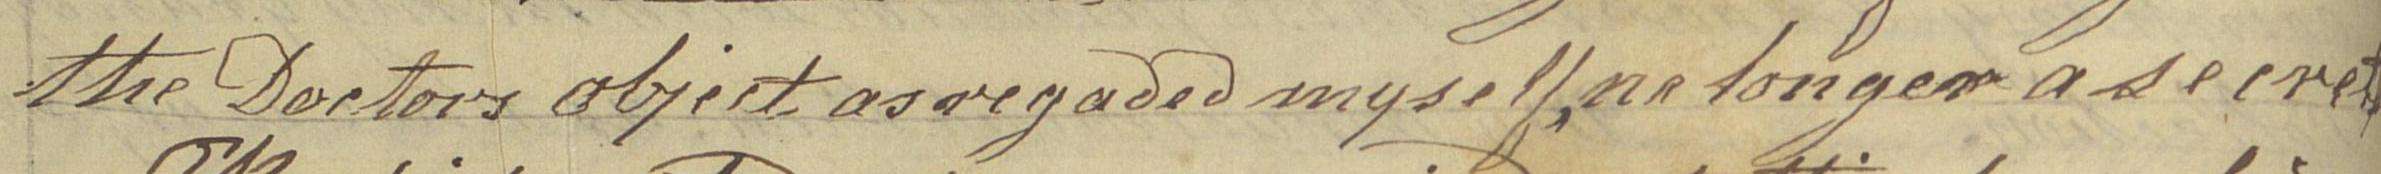the Doctors object as regaded myself, no longer a secret
